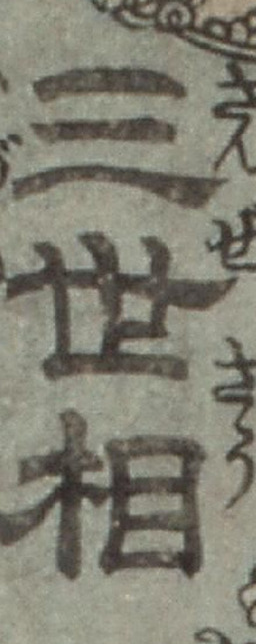三世相
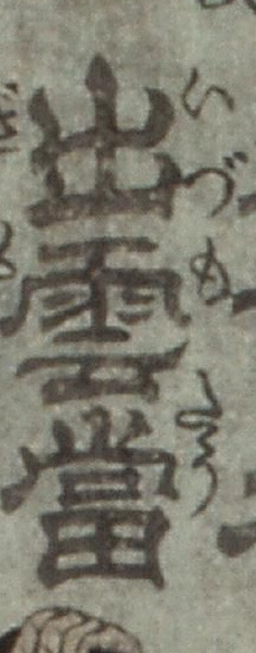出雲当
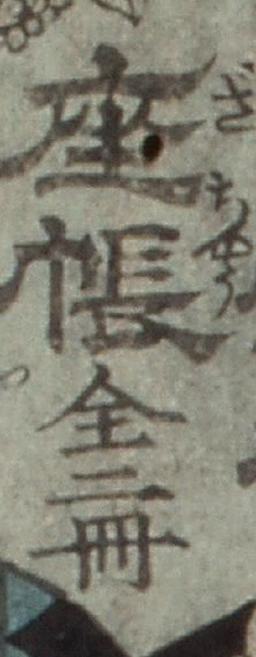座帳全二冊

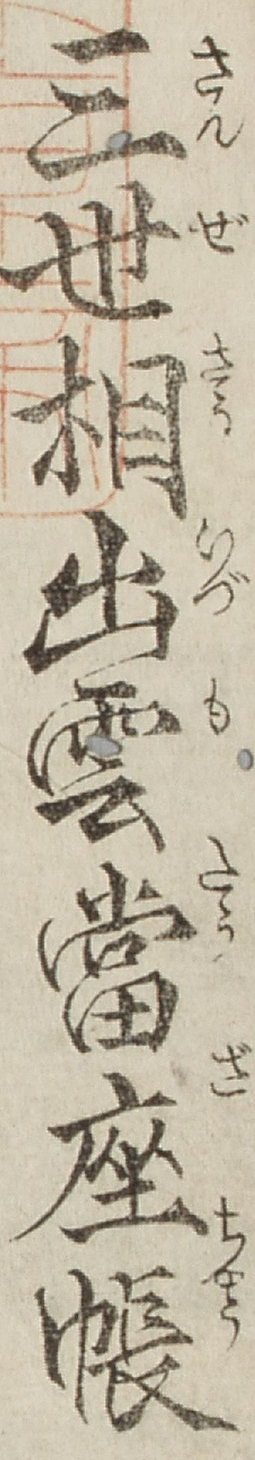三世相出雲当座帳
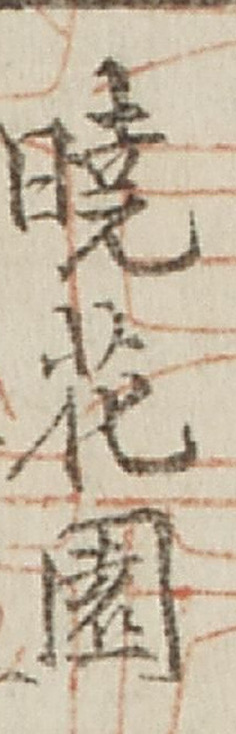曉花園
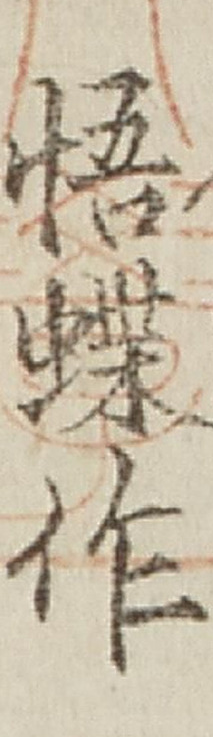悟蝶作
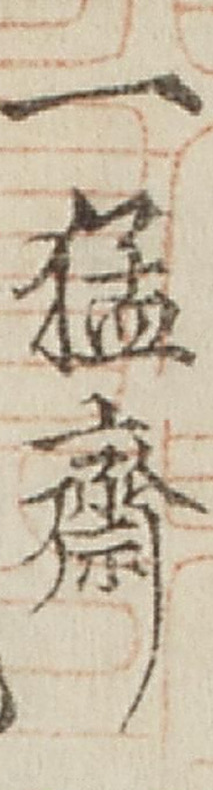一猛斎
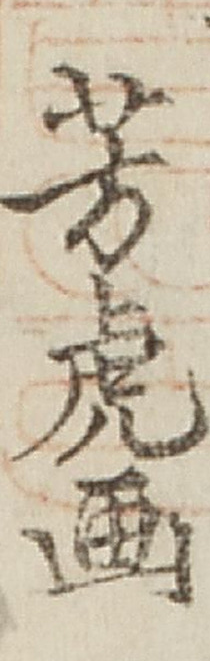芳虎画
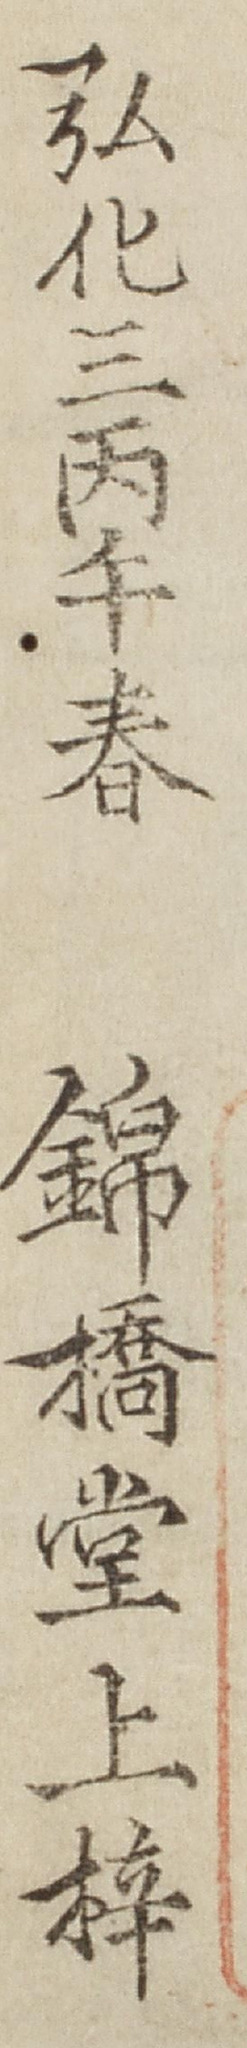弘化三丙午春錦橋堂上梓
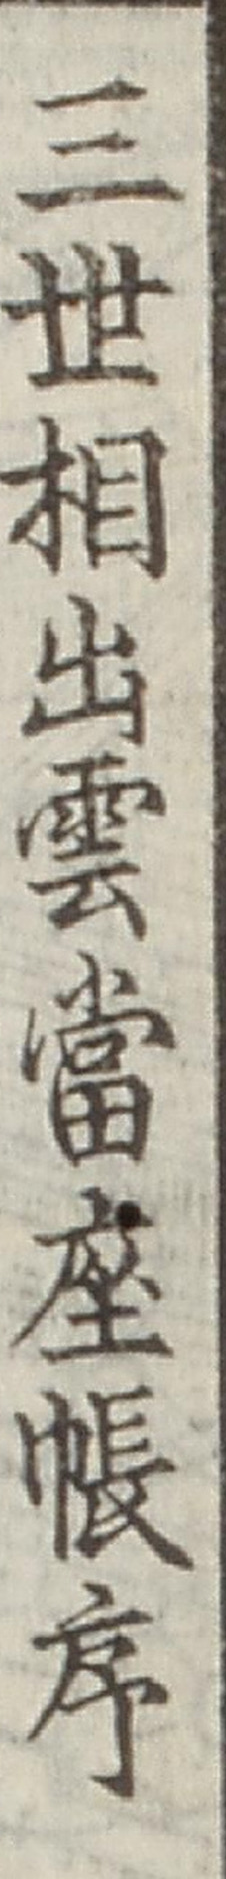三世相出雲当座帳序
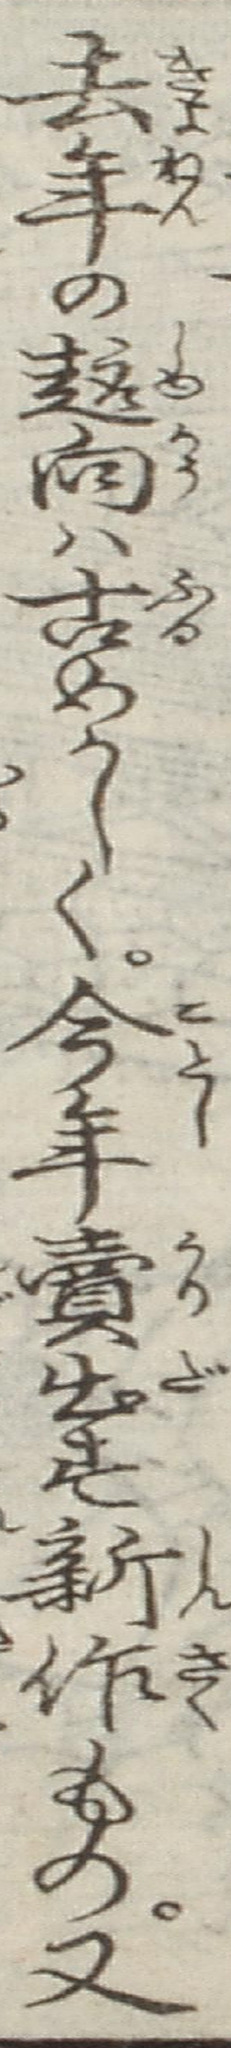去年の趣向は古めかしく。今年売出す新作もの。又
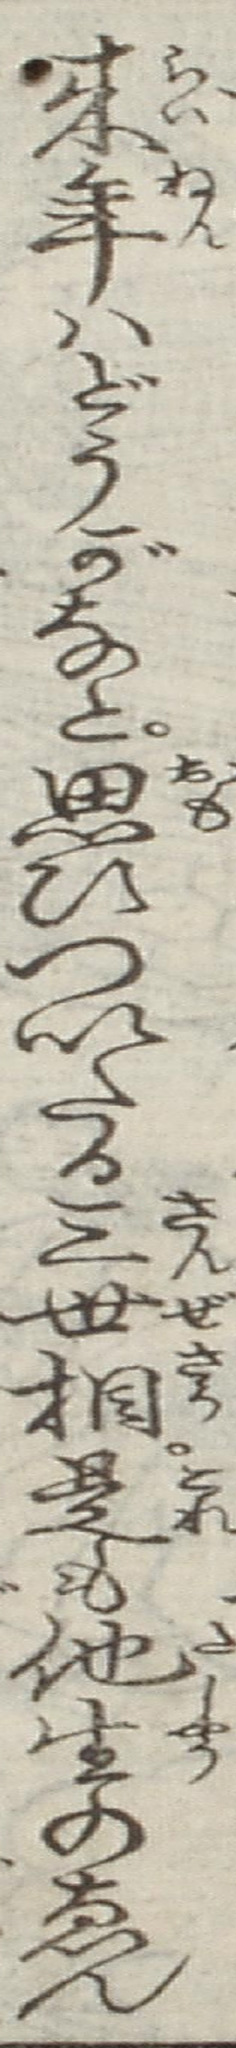來年はどうがなと。思ひついたる三世相。是も他生のゑん
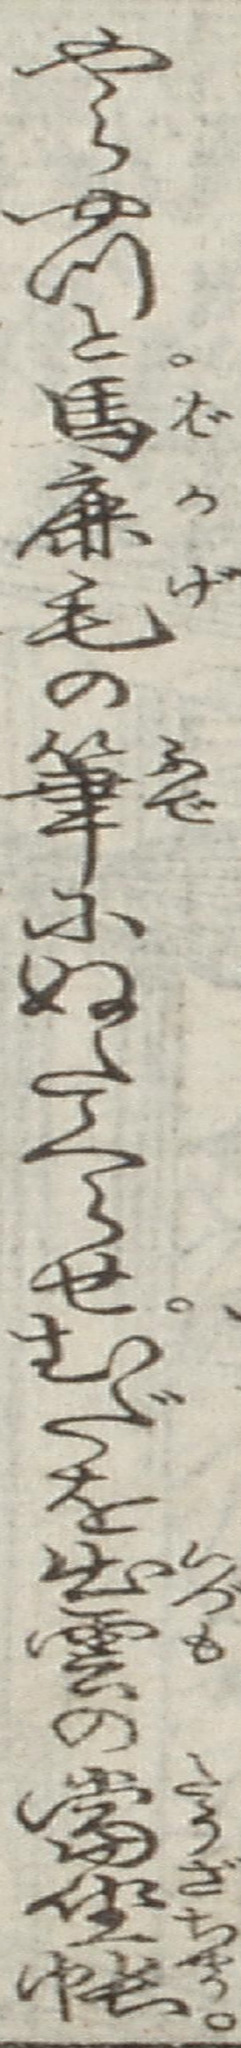やらやつと。馬鹿毛の筆にぬたくらせ。むだを出雲の当坐帳。
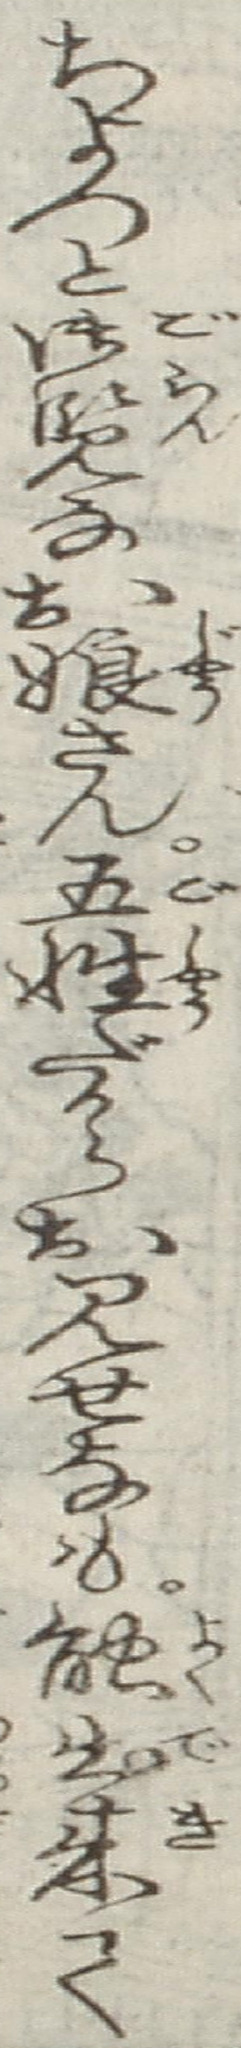ちよつと御覧なお娘さん。五性だからお見せなも。能出来て
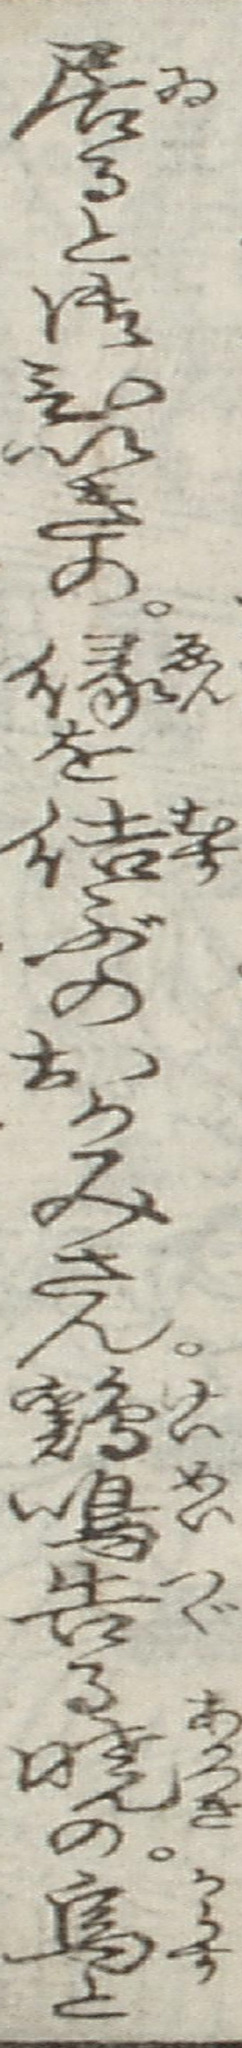居ると御ひいきの。縁を結ぶのおかみさん。鷄鳴告る曉の。烏と
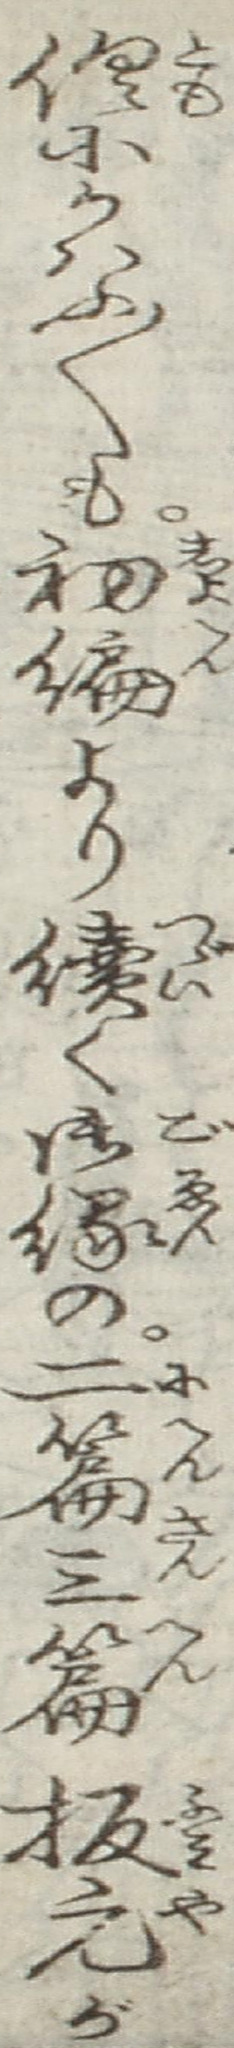俱にかはふ〳〵も。初編より続て御縁の。二篇三篇板元が
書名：三世相出雲當座帳　上下冊
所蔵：東京大学地震研究所図書室 Earthquake Research Institute Library, The University of Tokyo, JAPAN
